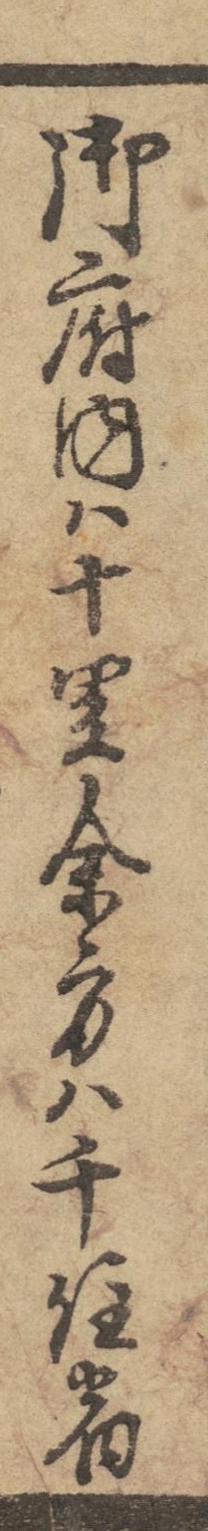御府内ハ十里余方ハ千住宿
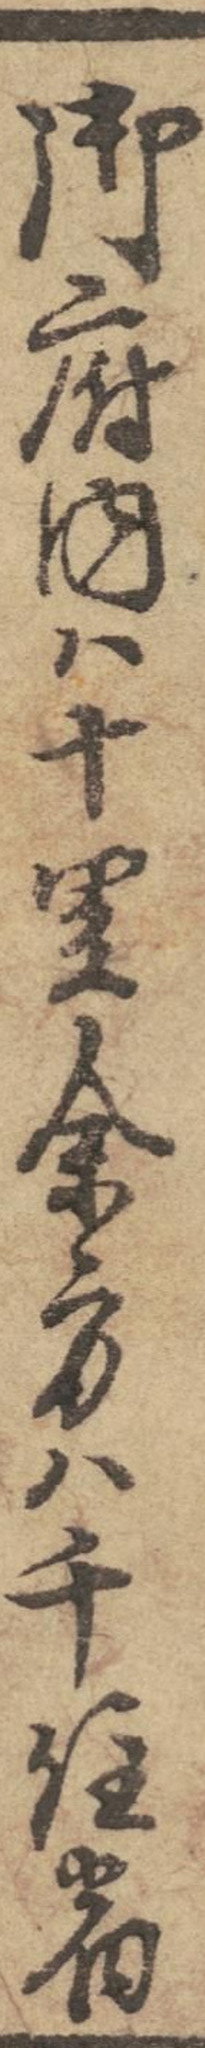御府内ハ十里余方ハ千住宿
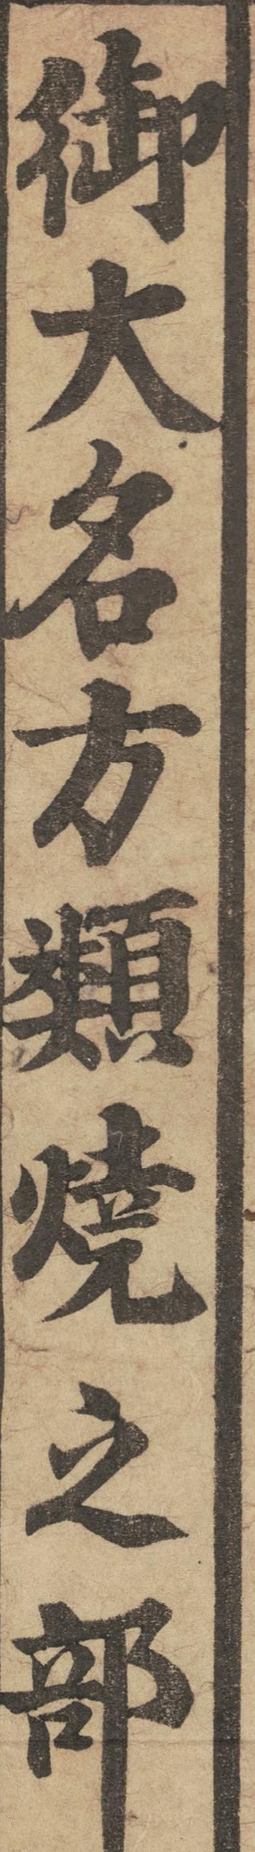御大名方類焼之部
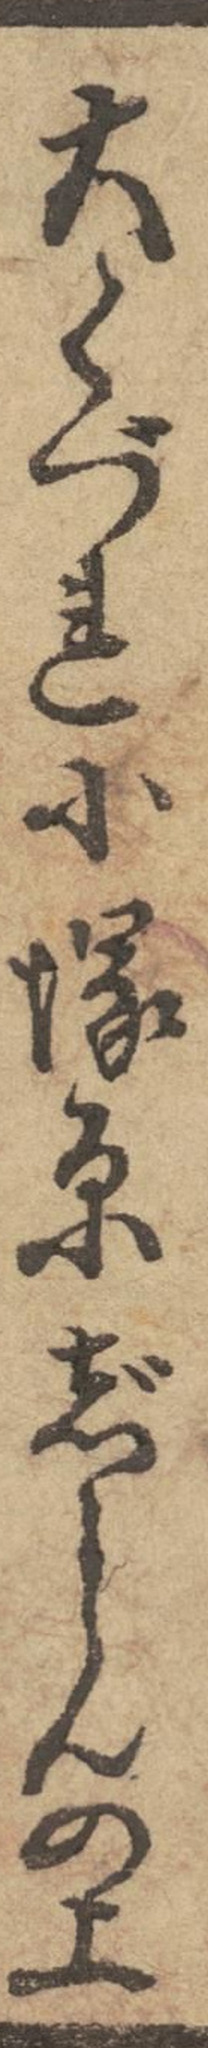大くづれ小塚原ぢしんの上
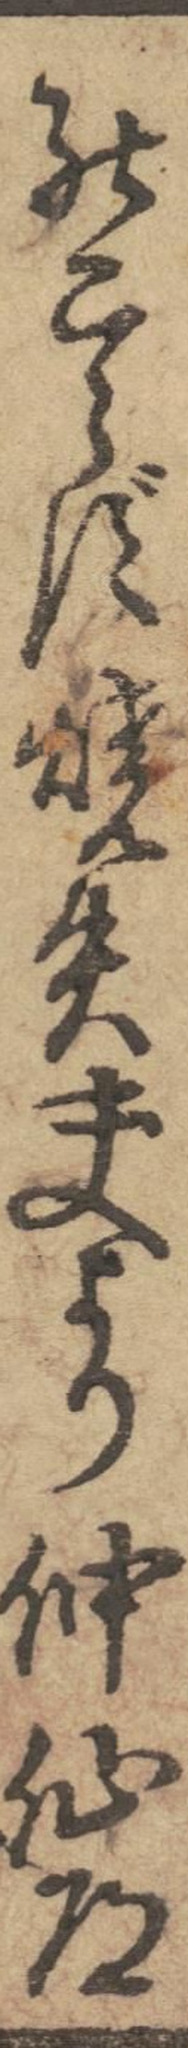のこらず焼失夫より中仙道
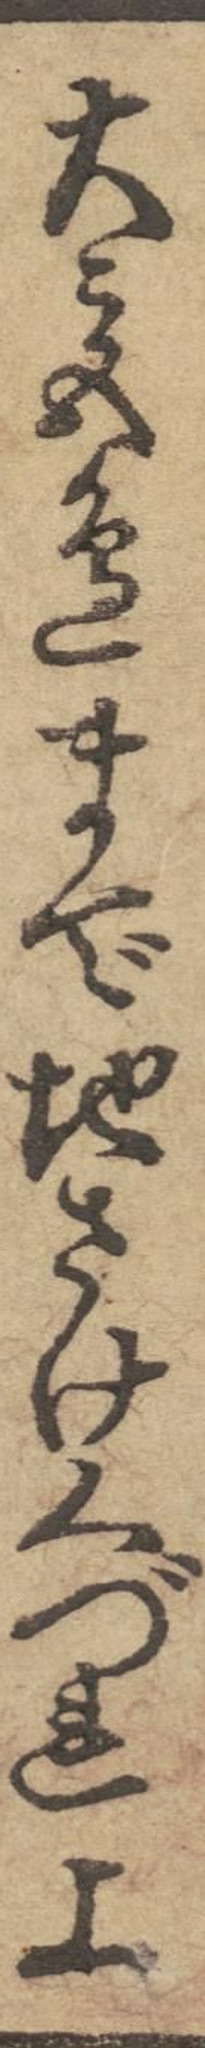大宮辺まで地さけくづれ上
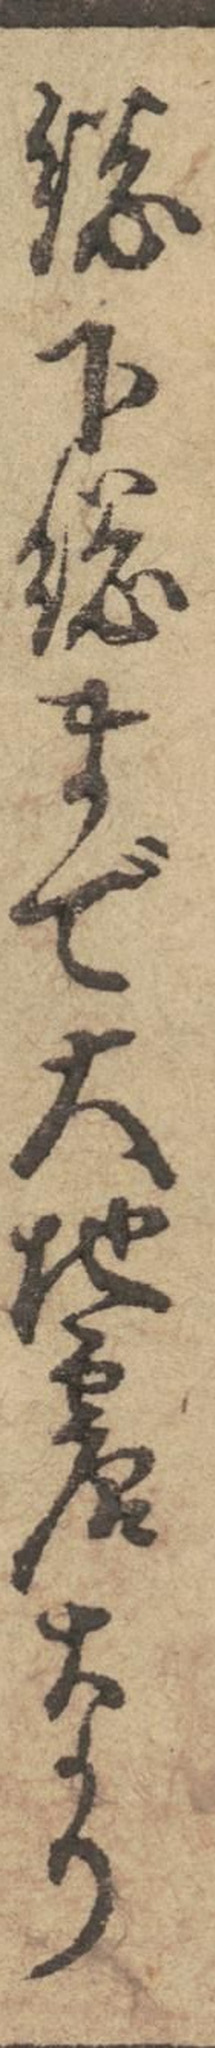総下総まで大地震はかり
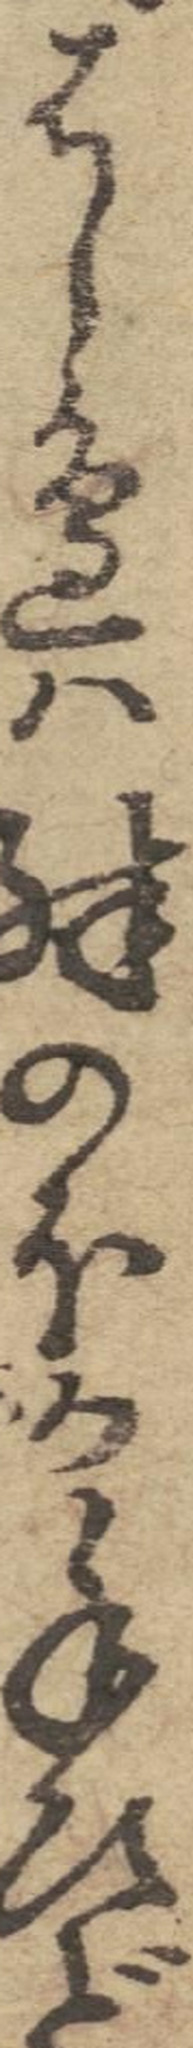舟はし辺ハ殊のほか手ひど
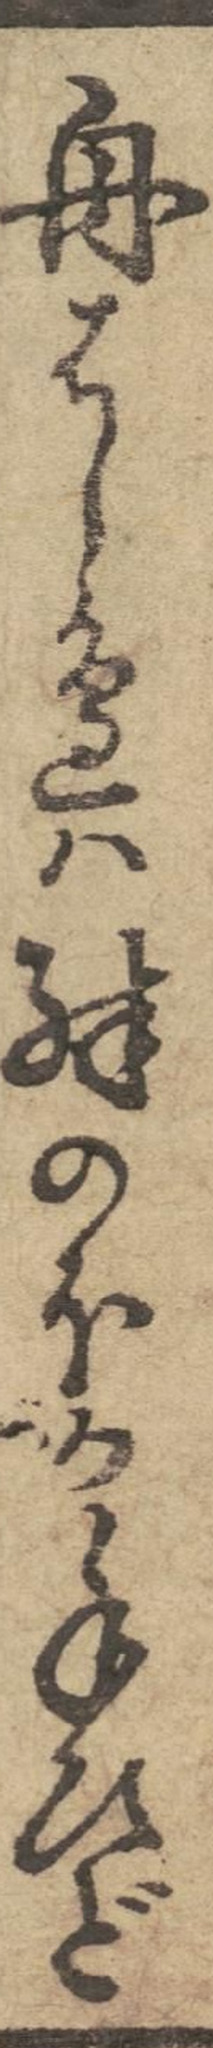舟はし辺ハ殊のほか手ひど
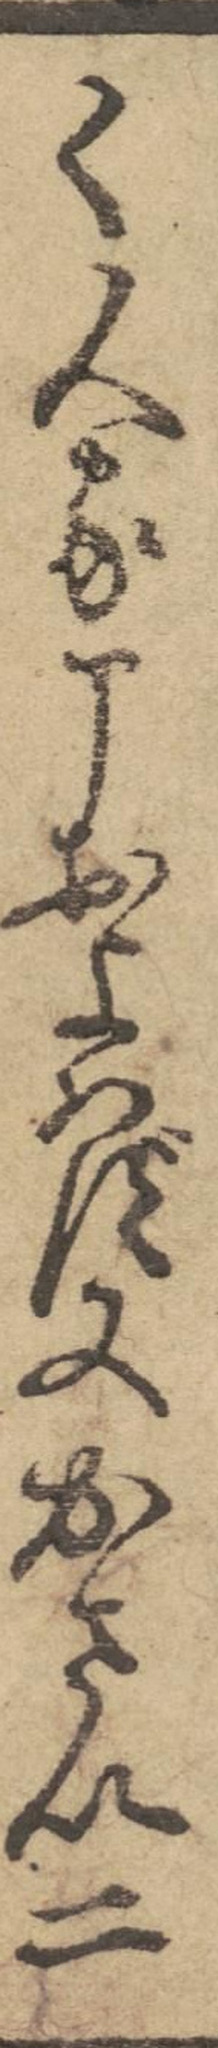く人家におよハず又かさい二
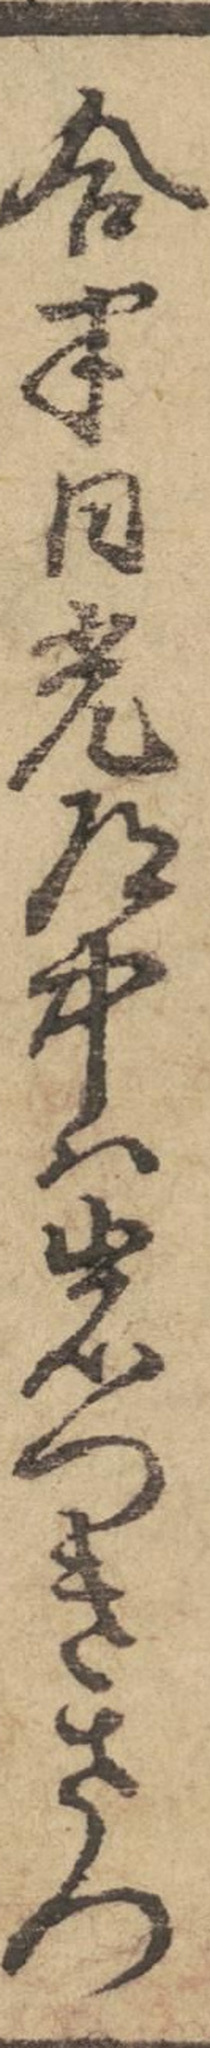合半日光道中ハ岩つきさつ
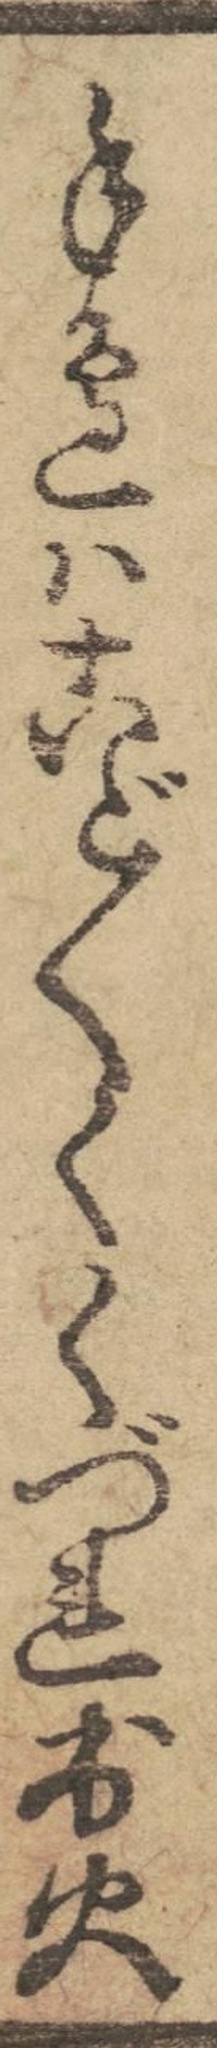手辺ハこと〴〵くくづれ出火
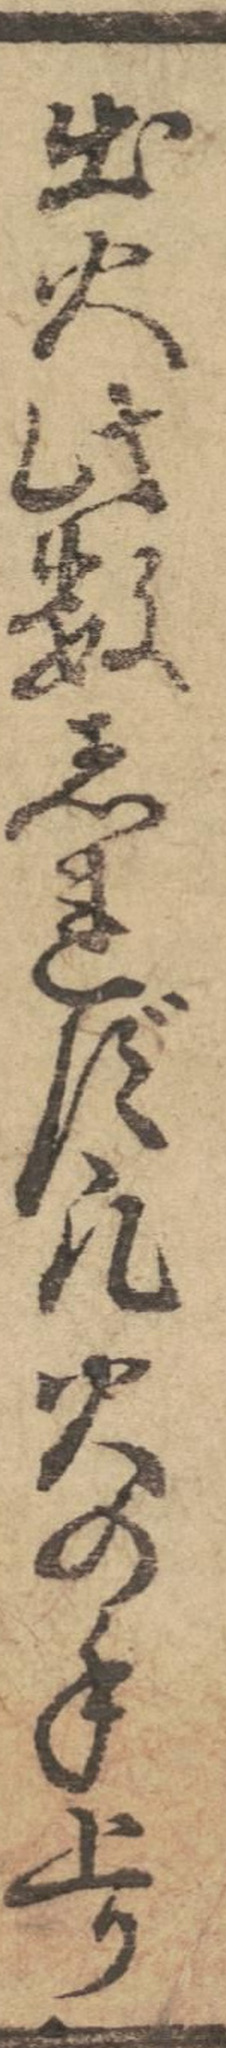出火此数しれず凡火の手上り
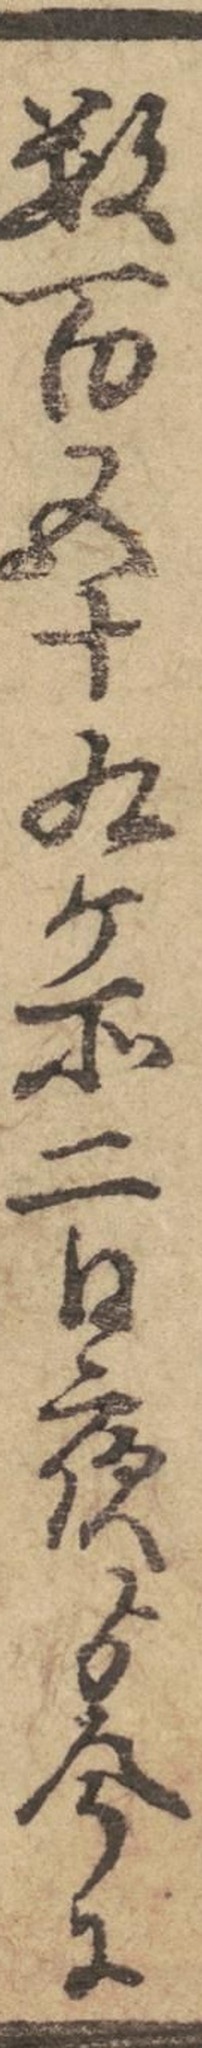数百五十九ヶ所二日夜ゟ今に
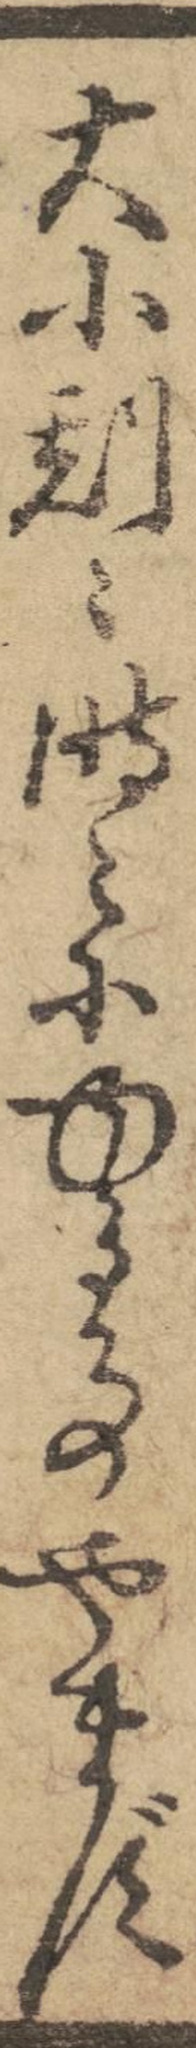大小刻々時々にゆるゝ事やまず
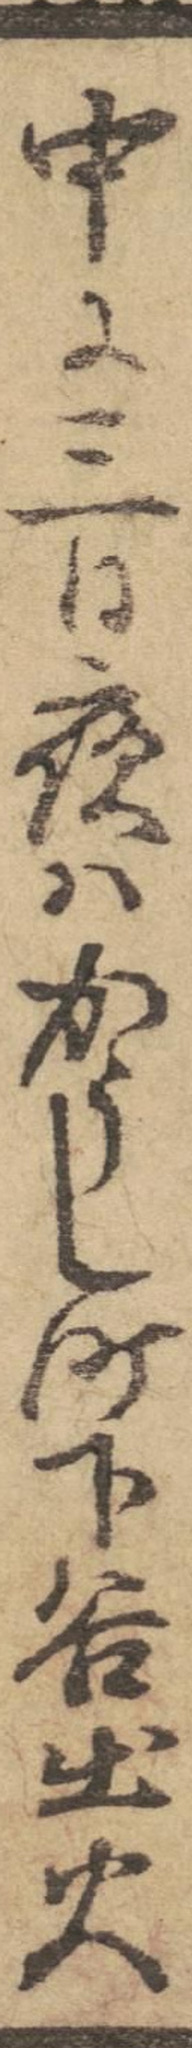中に三日夜ハかうし町下谷出火
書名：安政二乙卯歳十月二日夜ル四ツ時震始メ末代
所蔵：東京大学地震研究所図書室 Earthquake Research Institute Library, The University of Tokyo, JAPAN
